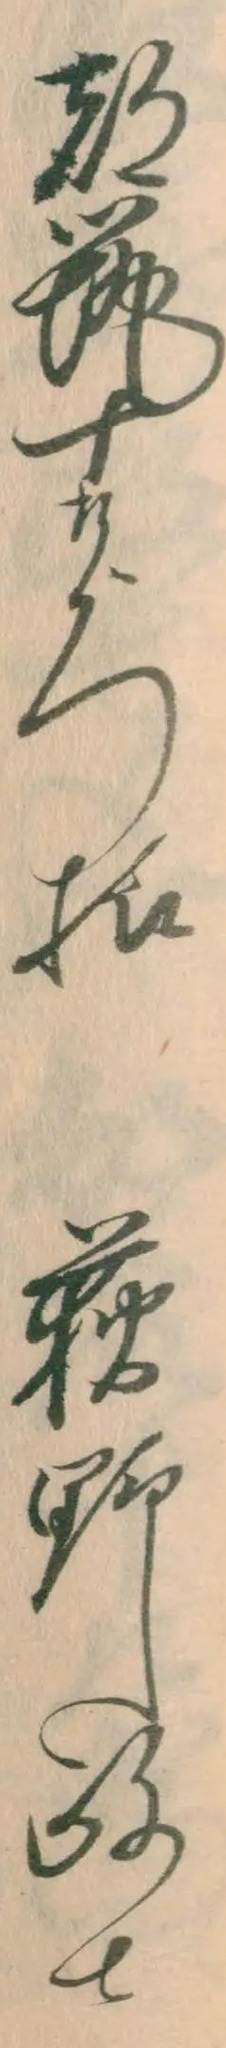都築十左衛門様荻野政七
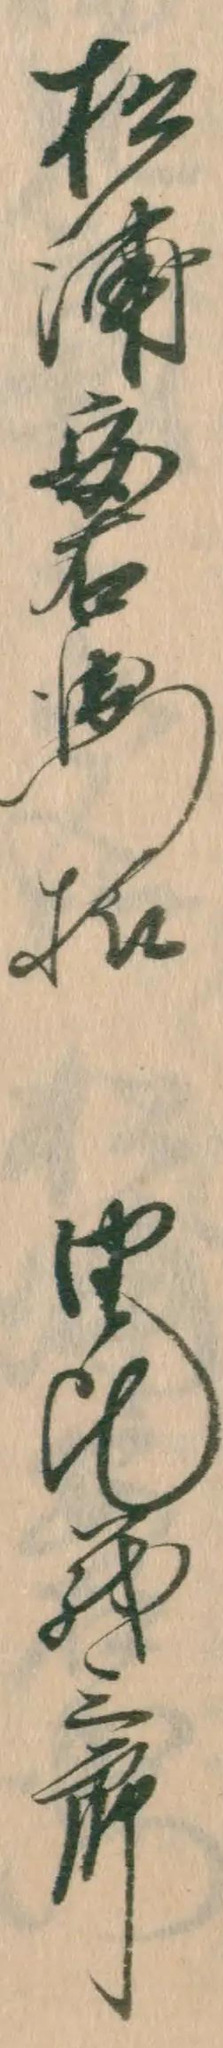松浦安右衛門様由比義三郎
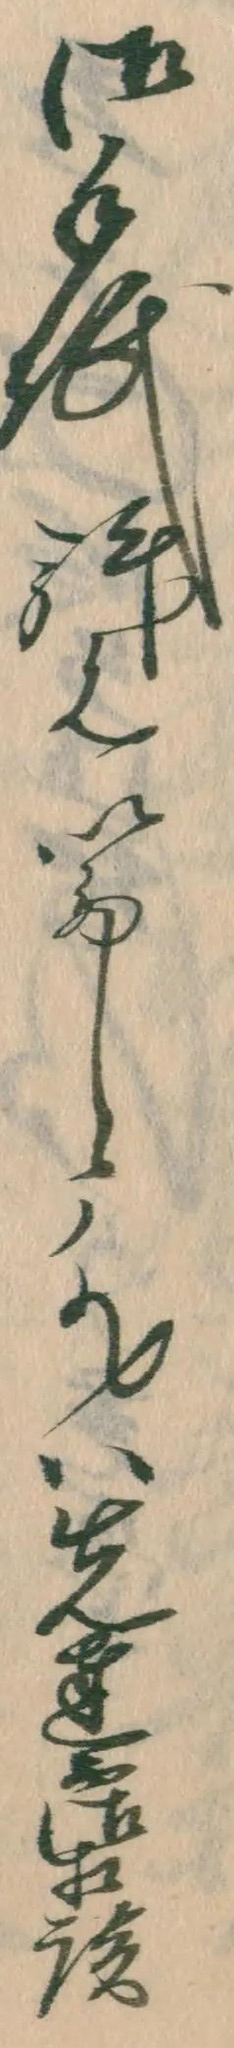御手紙拝見いたし候然ハ先達て相詰
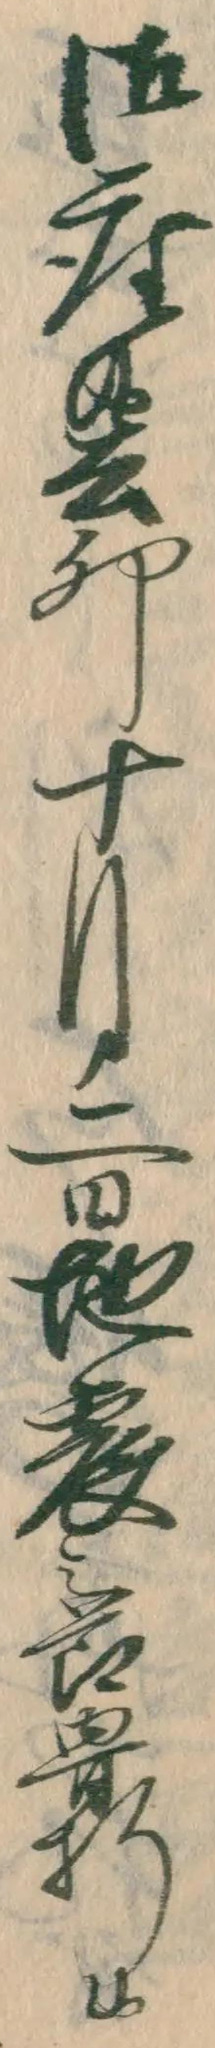御座候去卯十月二日地震之節骨折候
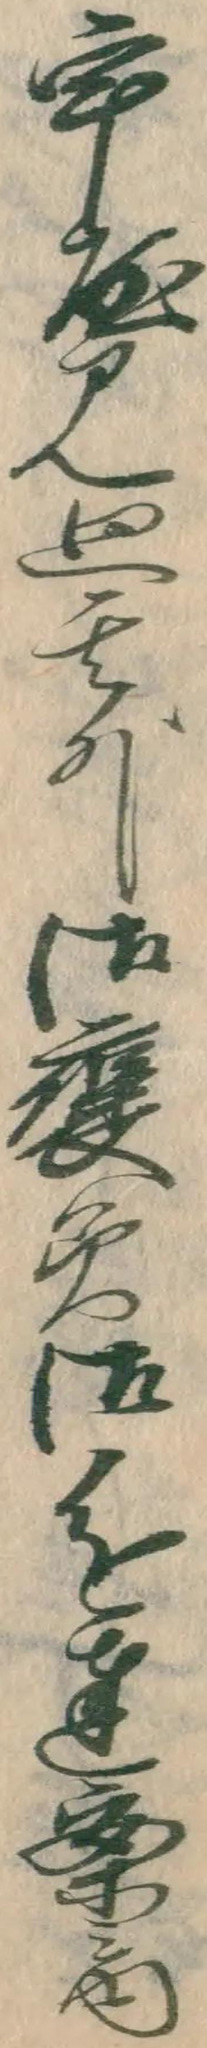牢屋見廻其外御褒美御進達案之内
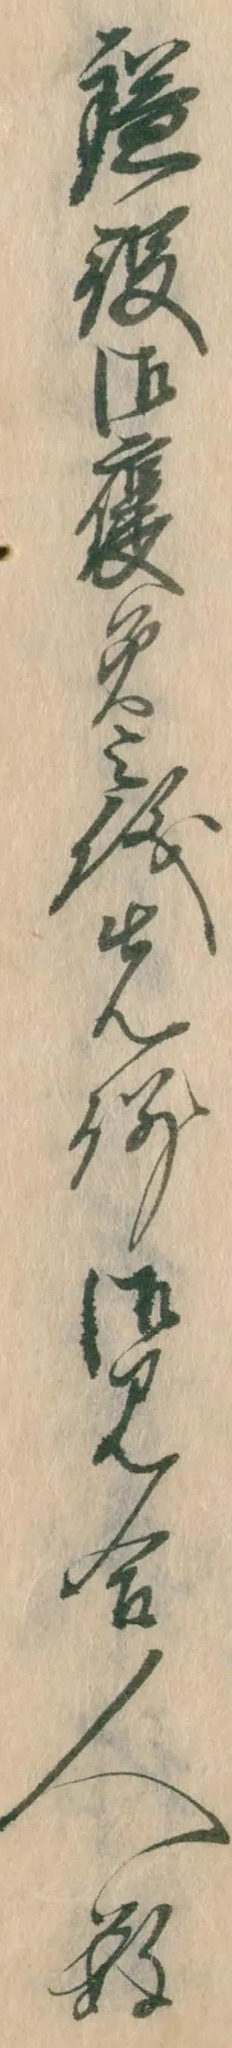鎰役御褒美之義先例御見合人数

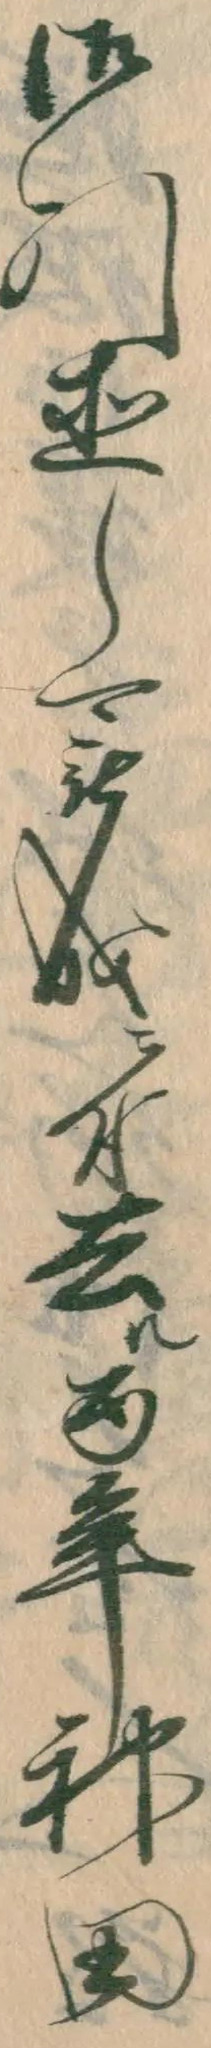御引直し可被成ニ付去ル酉年神田
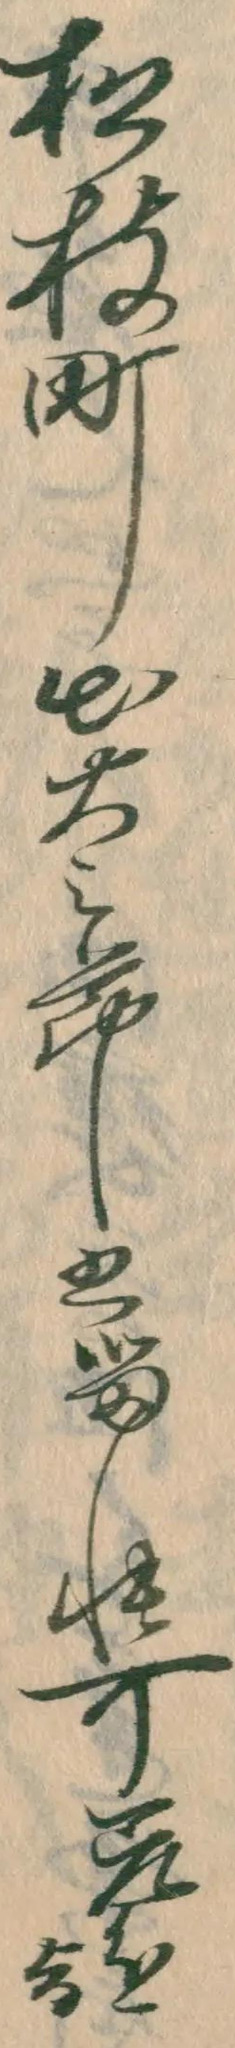松枝町出火之節書留帳可差遣旨
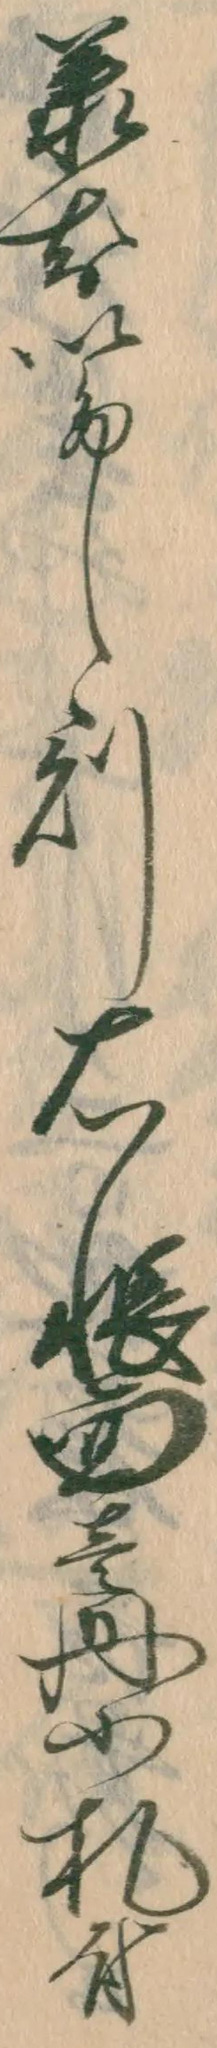承知いたし則右帳面壱冊小札付
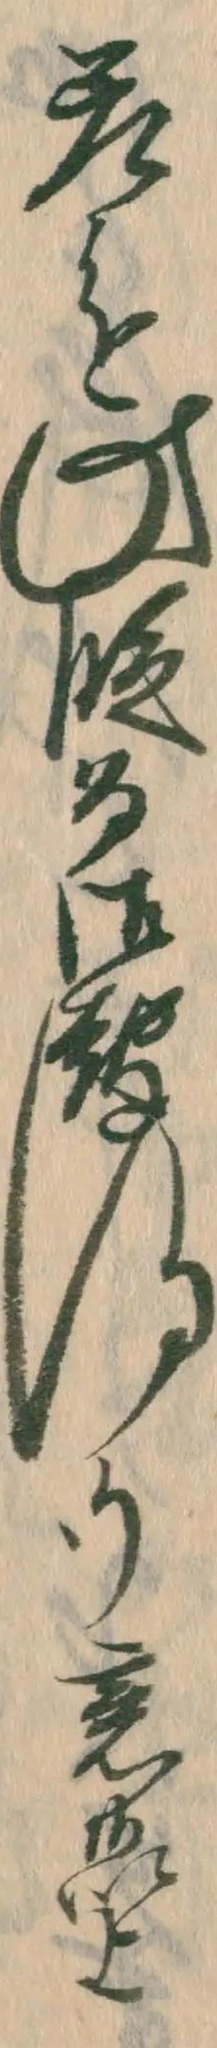差遣此段為御替得御意候以上
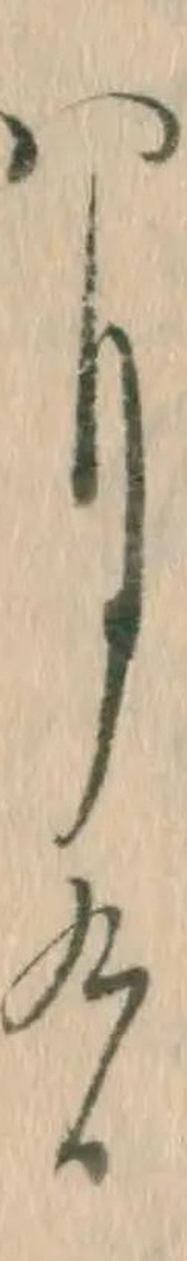八月九日
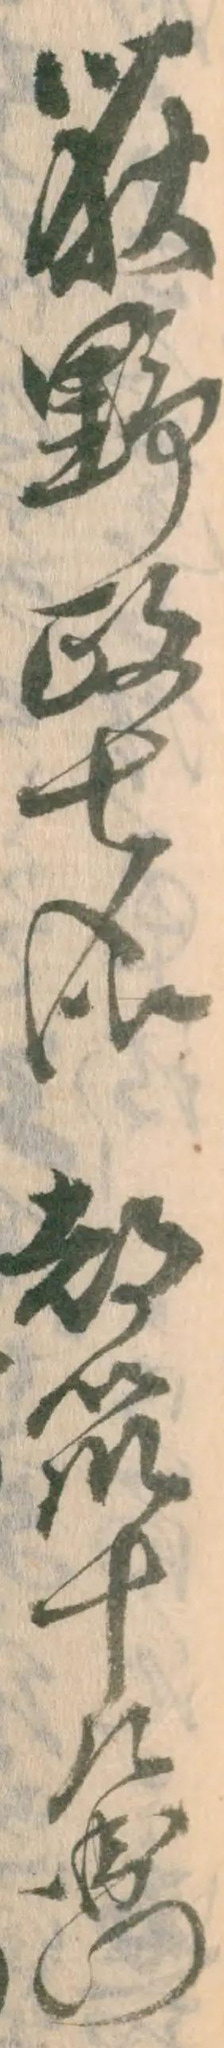荻野政七様都築十左衛門
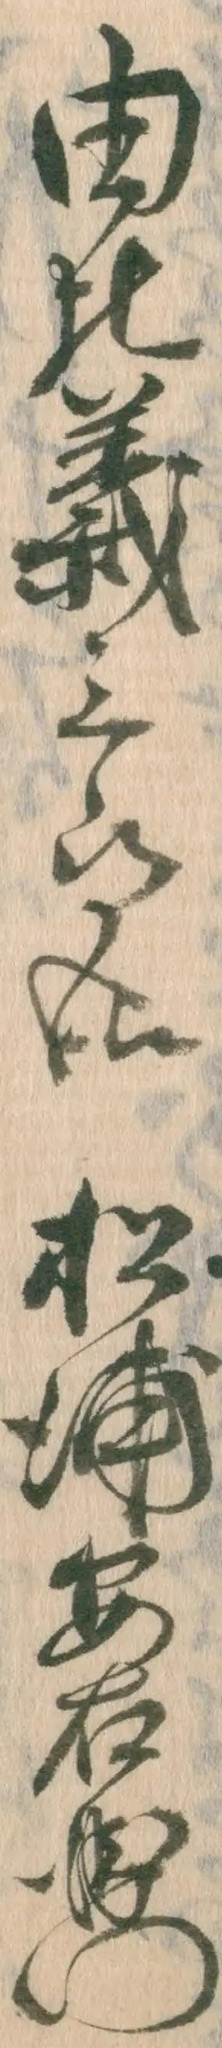由比義三郎様松浦安右衛門
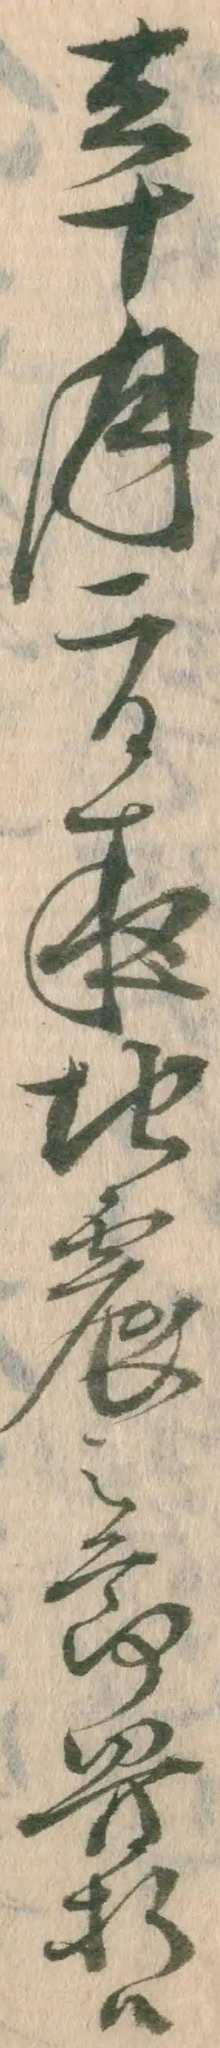去十月二日夜地震之節骨折候
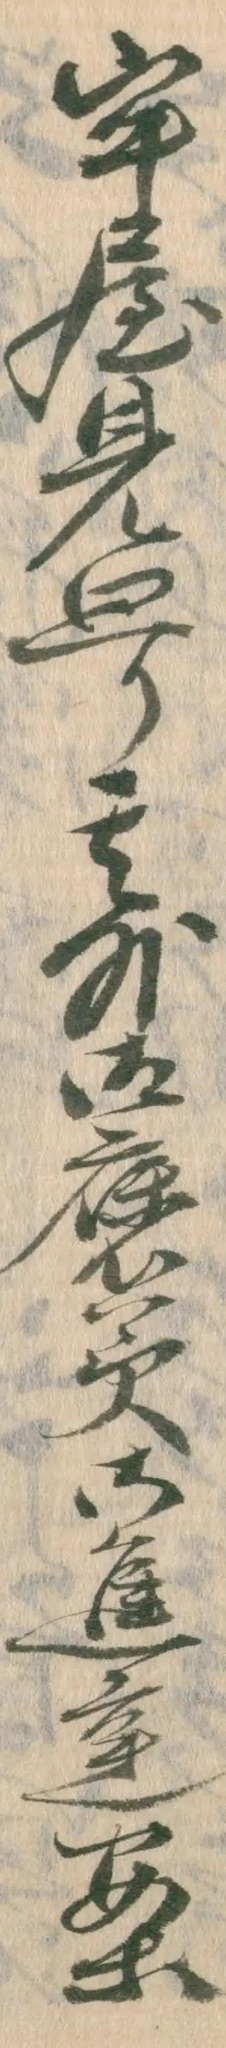牢屋見廻り其外御褒美御進達案
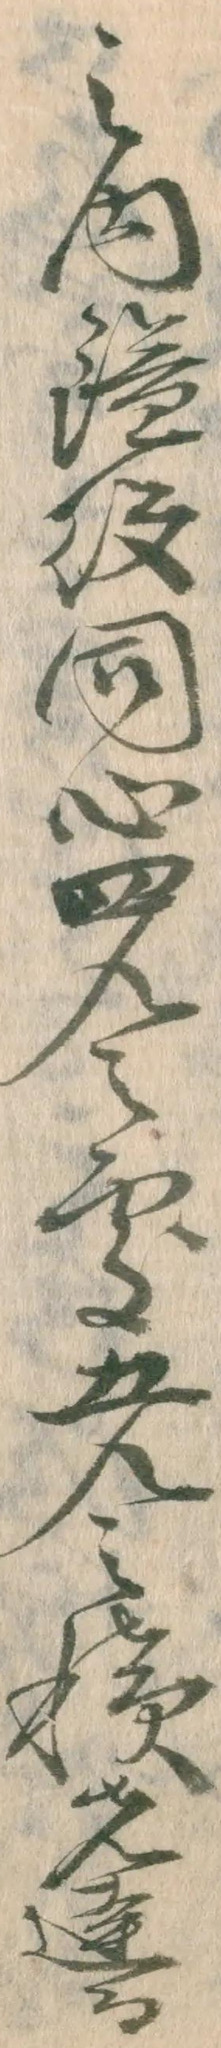之内鎰役同心四人之処五人之積先達て
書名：七十冊物類集 71巻. [44] 四十三 牢屋敷御普請御修覆地震ニ付骨折候牢屋掛御褒美之部
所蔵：国立国会図書館 National Diet Library, JAPAN
